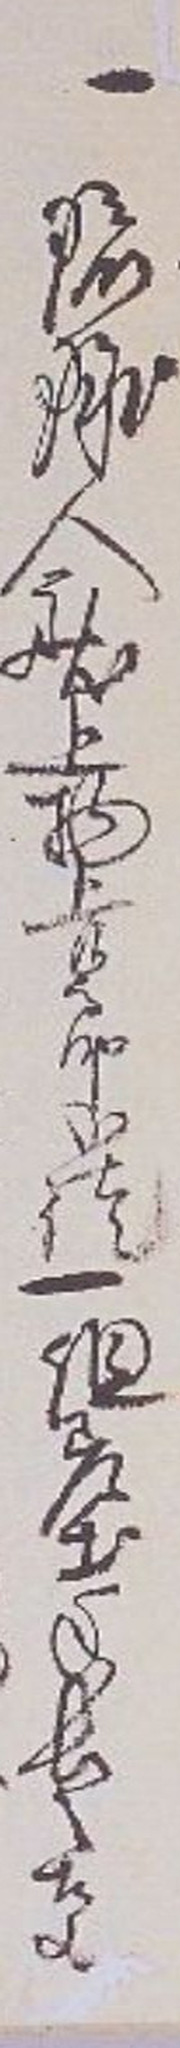一琉球人献上物上候節御徒一組差出手長之事
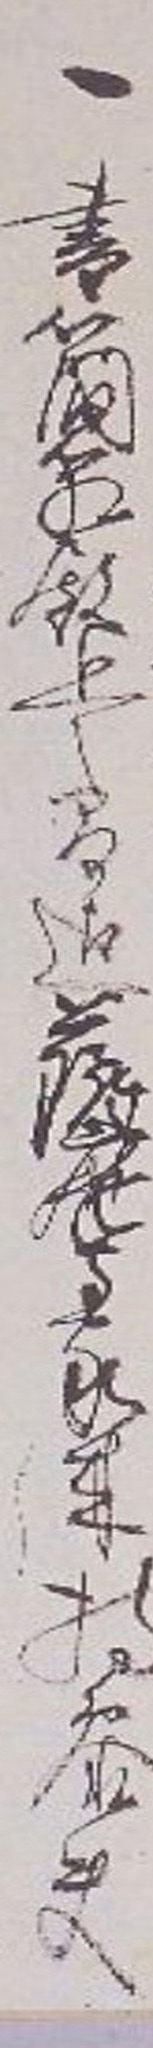一書簡箱殿上之間迄薩摩守家来持参夫
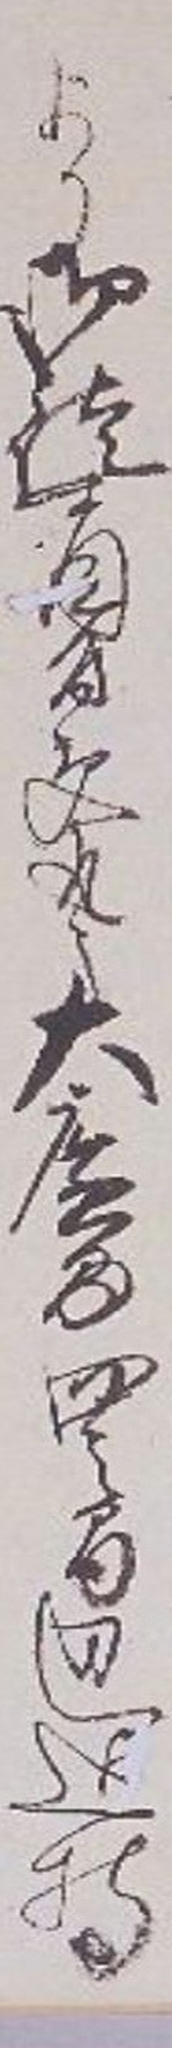より御徒士目付受取之大広間四之間辺迄持

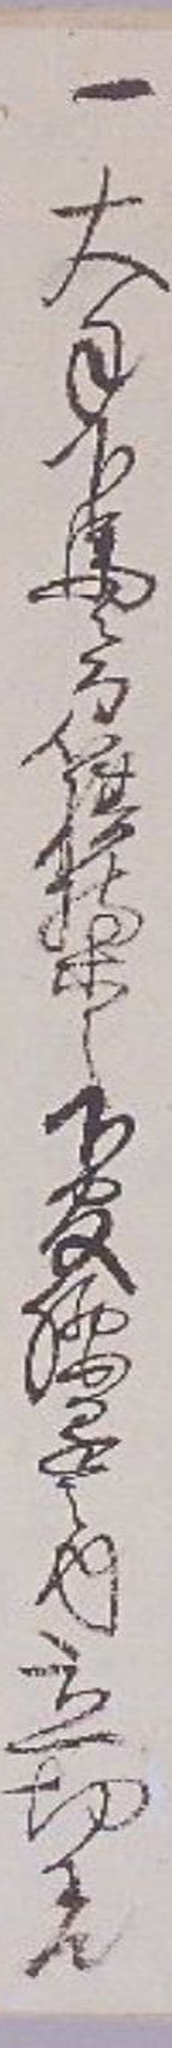一大手下馬に而旗持等之下官腰懸之内立切差
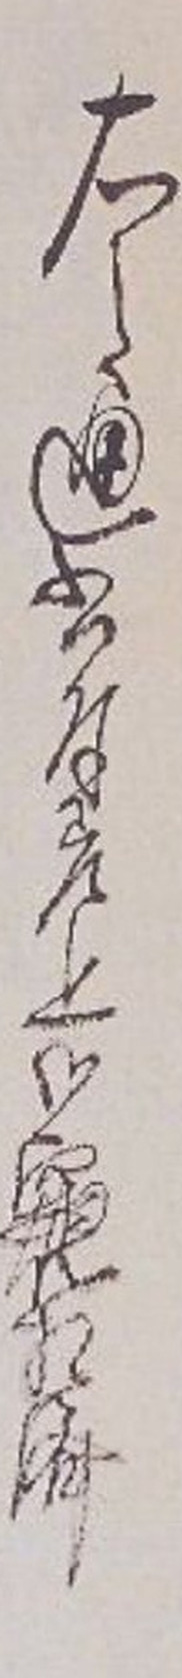右之通書付差上御窺相済
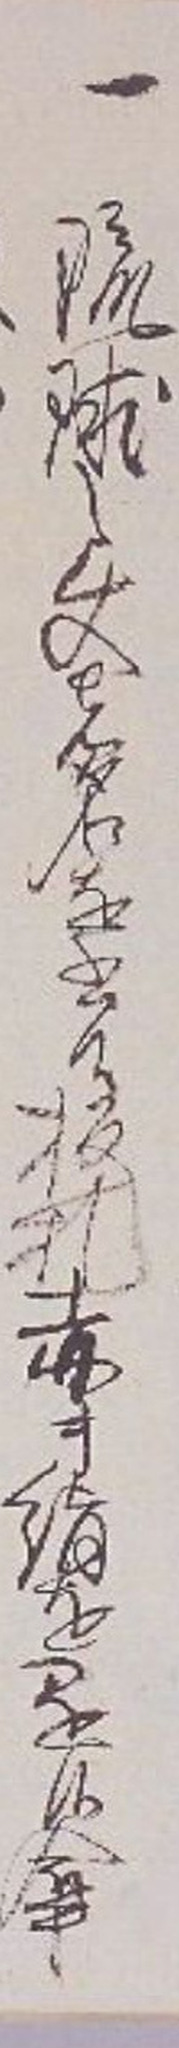一琉球之使者名を書候板札赤き絹を懸候傘
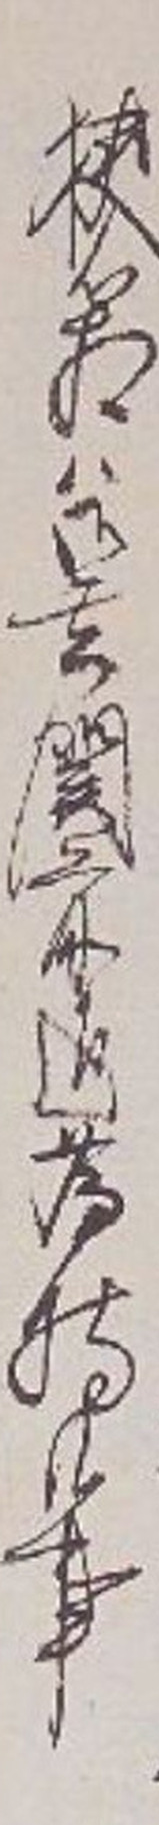挟箱は御玄関前迄為持候事
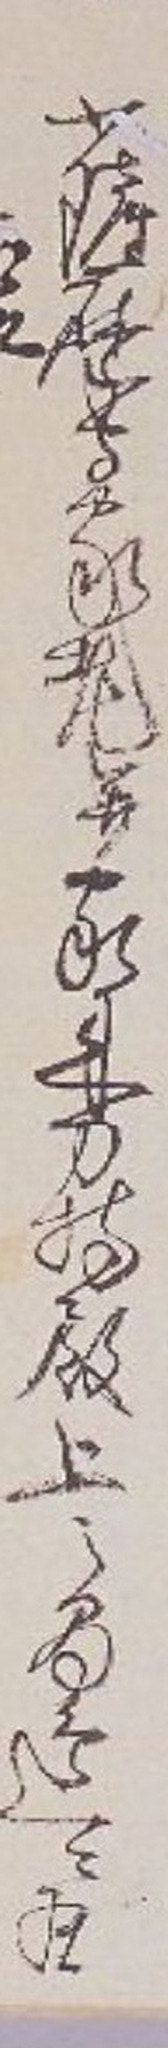一薩摩守家老并家来刀持殿上之間辺に為
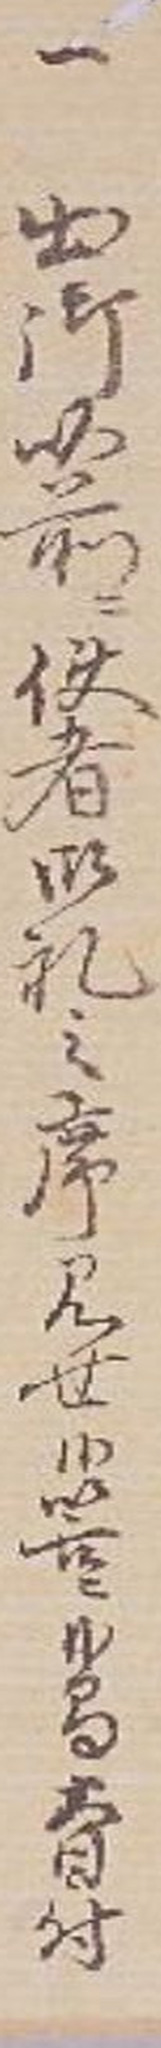一出御以前に使者御礼之席見せ候筈に候間大目付
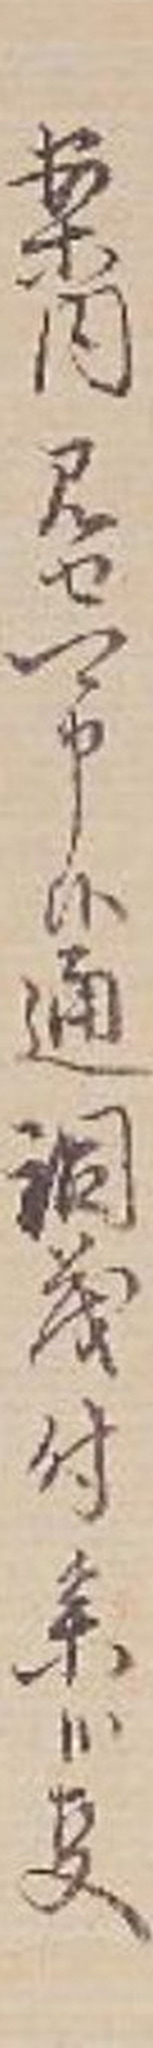案内見せ可申候通詞も付参候事
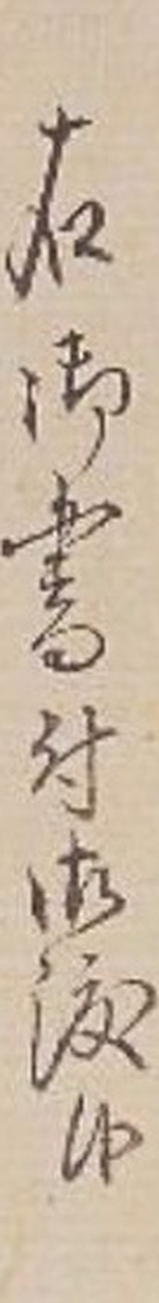右御書付御渡候
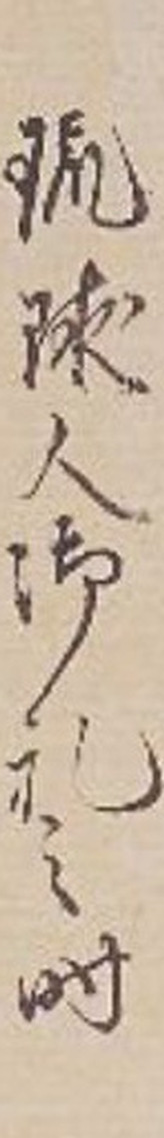琉球人御礼之時
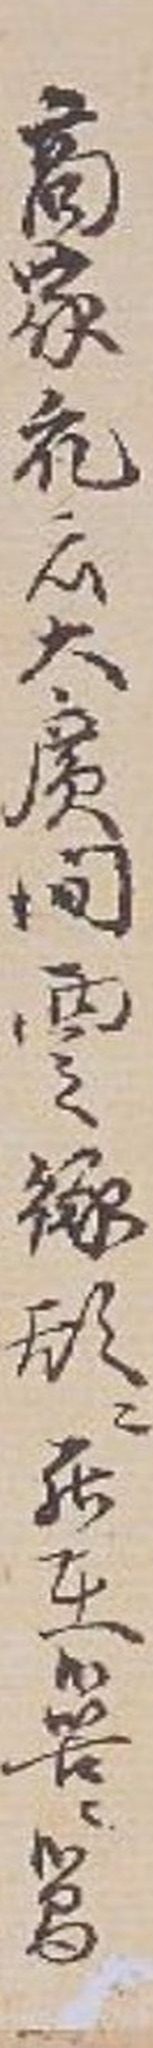高家衆は大広間西之縁頬に罷在候筈に候間
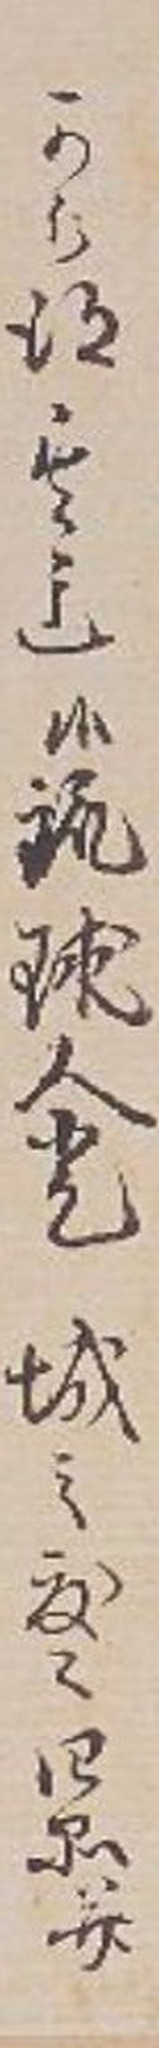可被得其意候琉球人登城之度々四品并
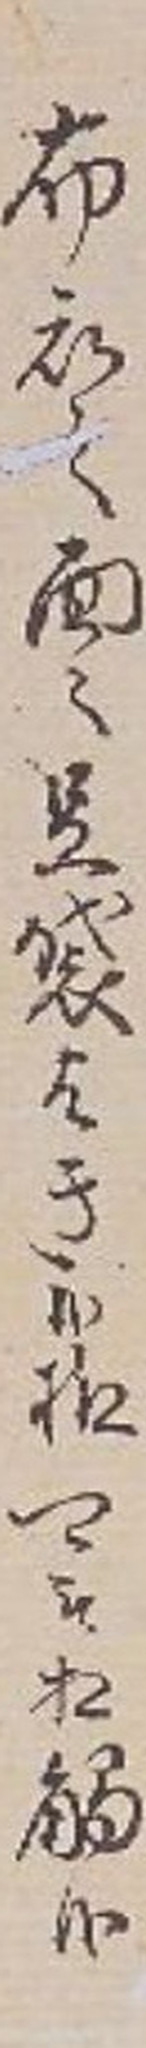布衣之面々足袋はき候様可被相触候

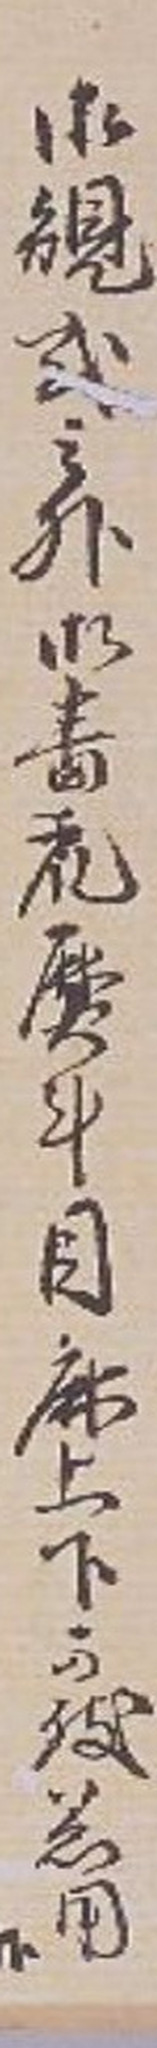御規式之外御番衆熨斗目麻上下可致着用候
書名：宝永七年 琉球人来聘
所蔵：University of the Ryukyus Library
